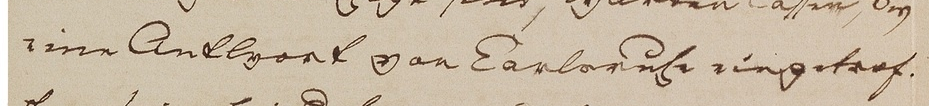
eine Antwort von Carlsruhe eingetrof-
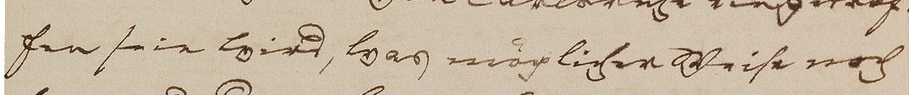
fen sein wird, was möglicher Weise noch
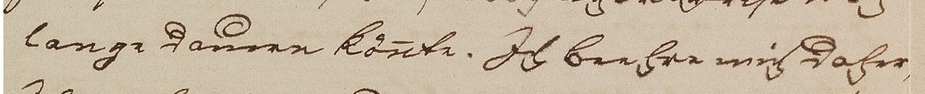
lange dauern könnte. Ich beehre mich daher,
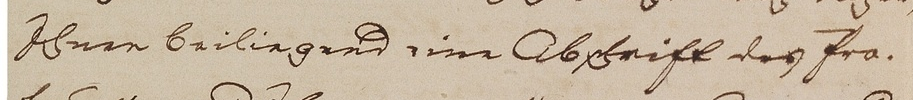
Ihnen beiliegend eine Abschrift des Pro-
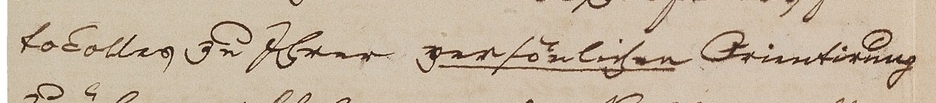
tokolles zu Ihrer persönlichen Orientirung
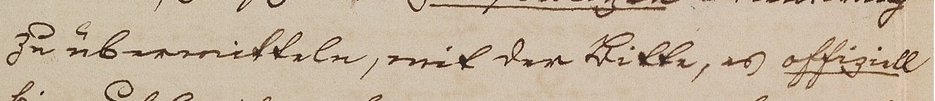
zu übermitteln, mit der Bitte, es offiziell
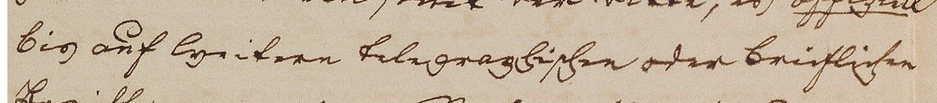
bis auf weitern telegraphischen oder brieflichen
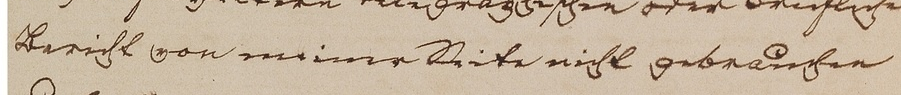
Bericht von meiner Seite nicht gebrauchen
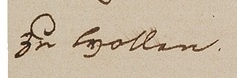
zu wollen.
